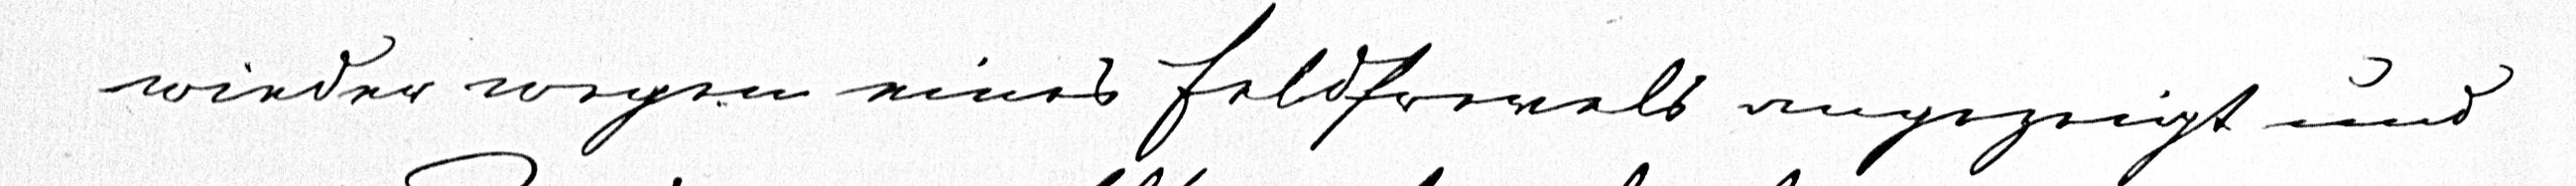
wieder wegen eines Feldfrevels angezeigt und
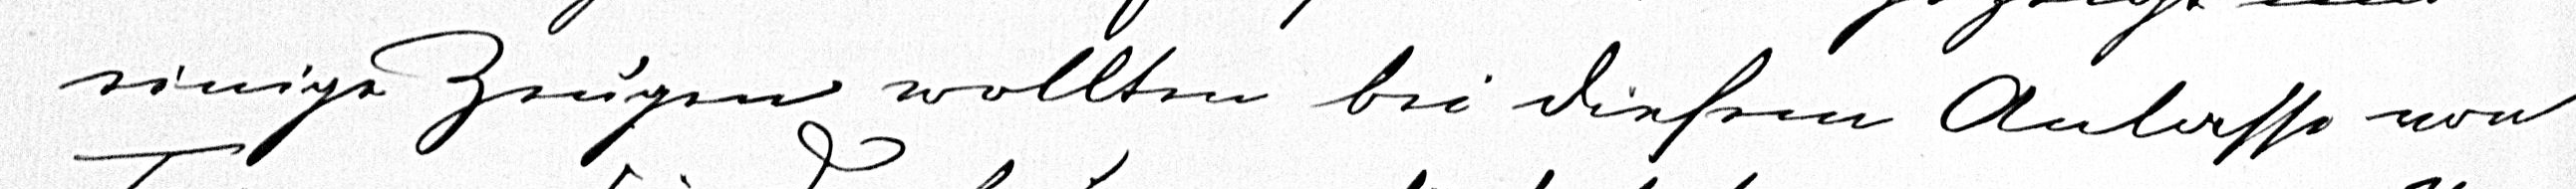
einige Zeugen wollten bei diesem Anlasse von
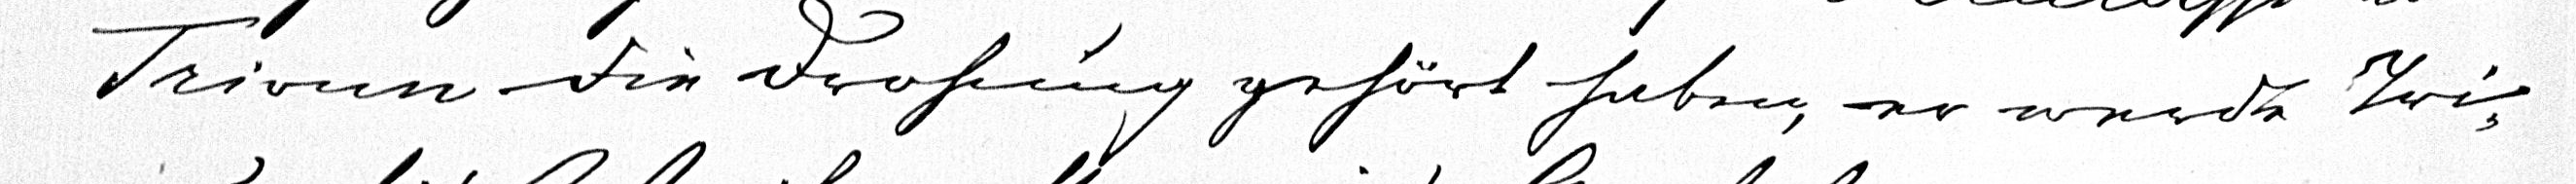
Trivun die Drohung gehört haben, er werde Tri¬
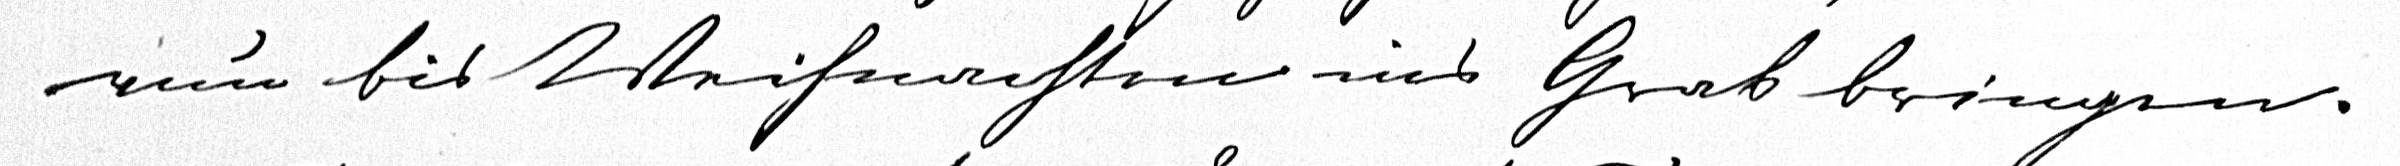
vun bis Weihnachten ins Grab bringen.
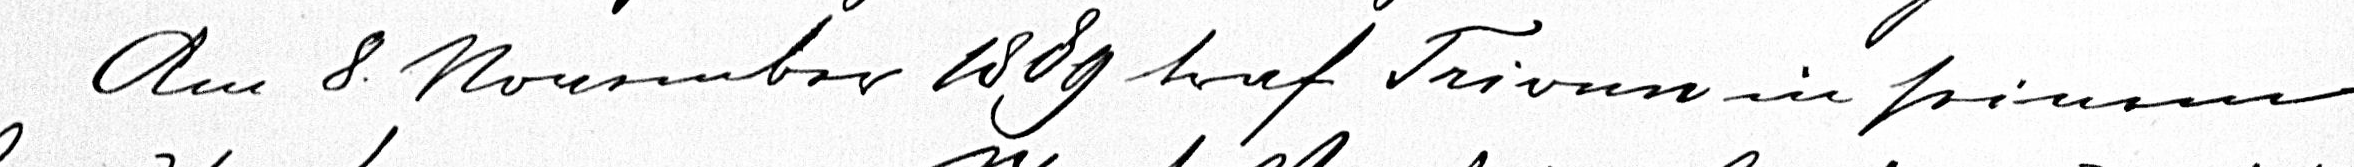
Am 8. November 1889 traf Trivun in seinem
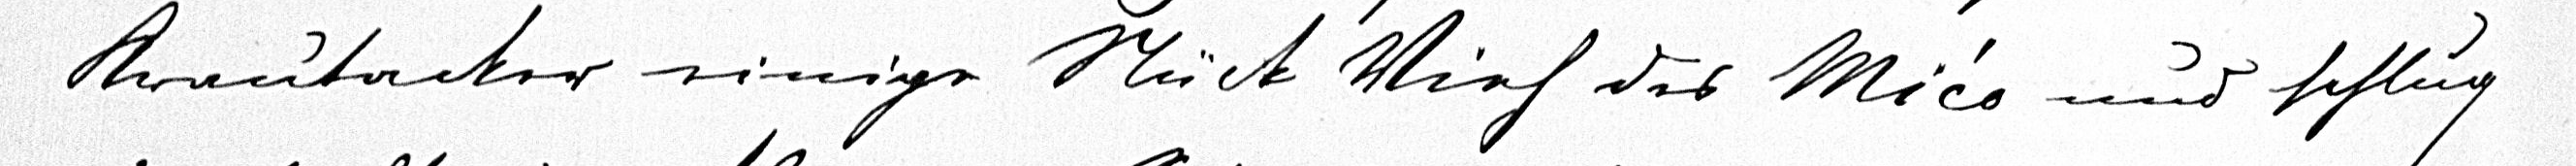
Krautacker einige Stück Vieh des Mićo und schlug
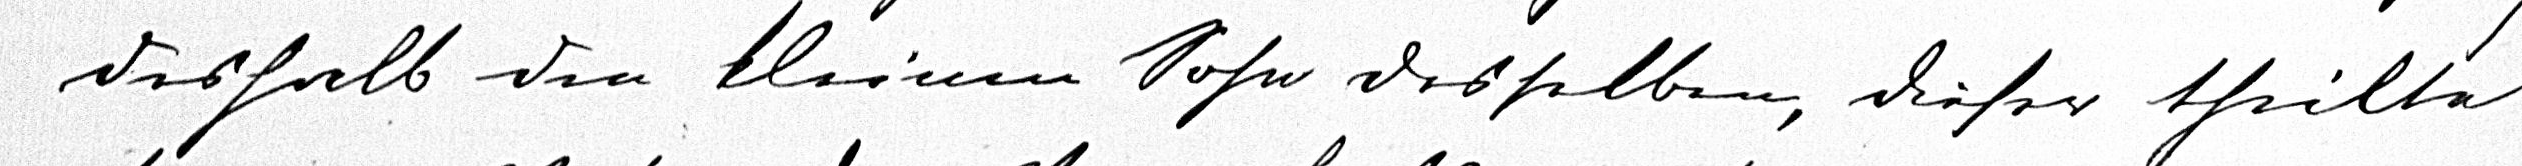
deshalb den kleinen Sohn desselben, dieser theilte
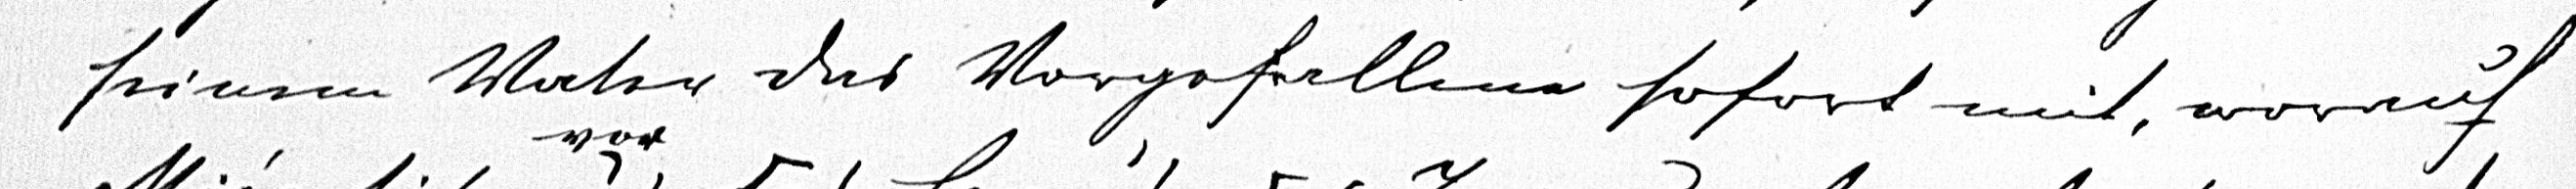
seinem Vater das Vorgefallene sofort mit, worauf
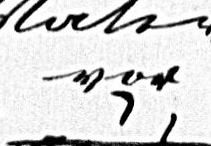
vor
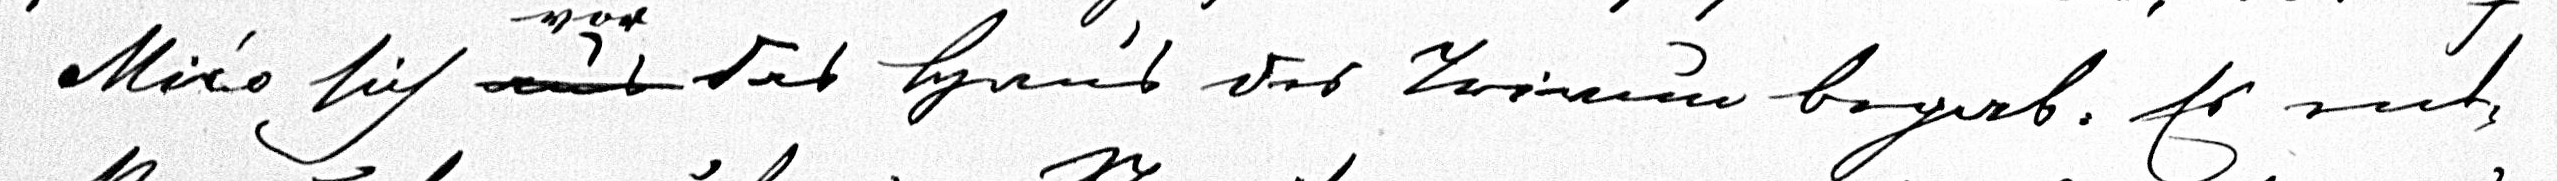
Mićo sich das Haus des Trivun begab. Es ent¬
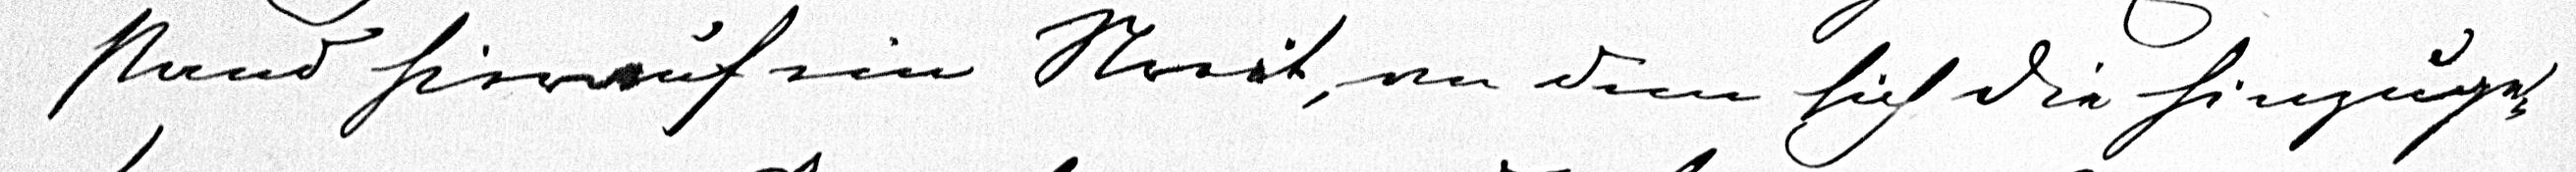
stand hierauf ein Streit, an dem sich die hinzuge¬
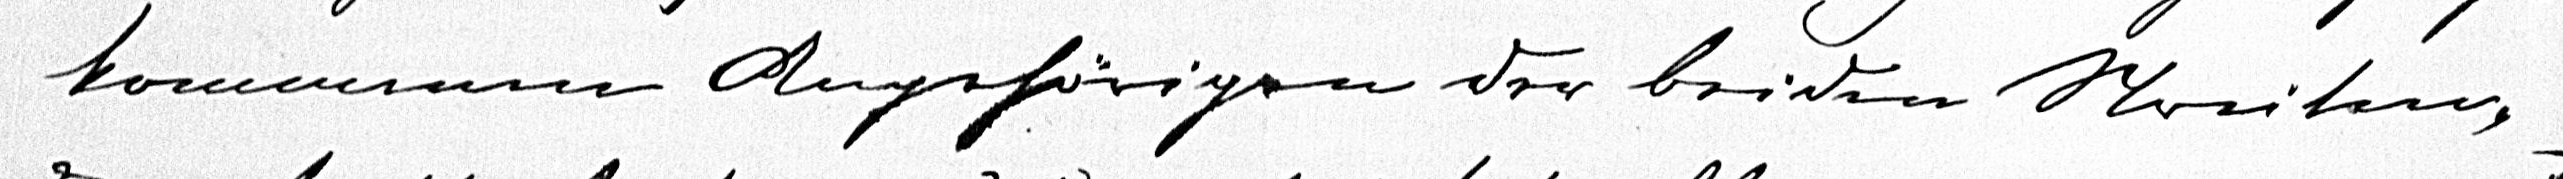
kommenen Angehörigen der beiden Streiten¬
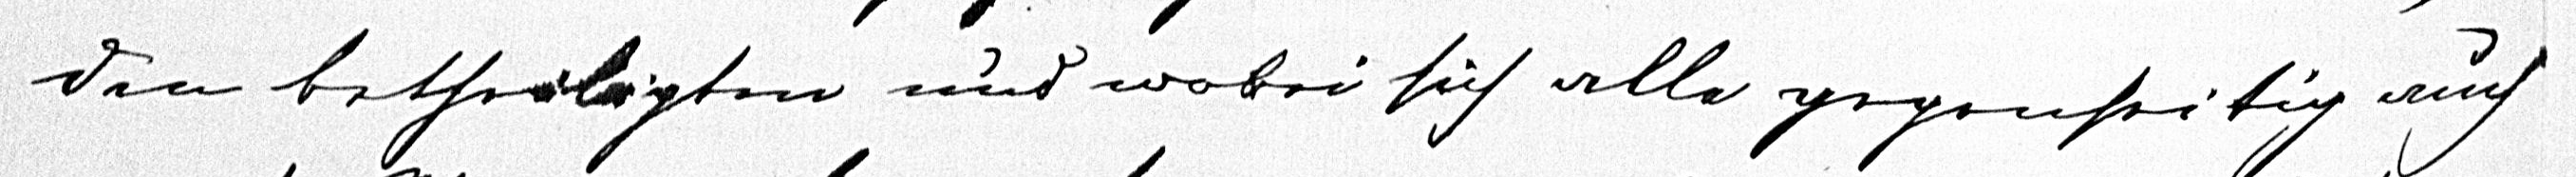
den betheiligten und wobei sich alle gegenseitig auch
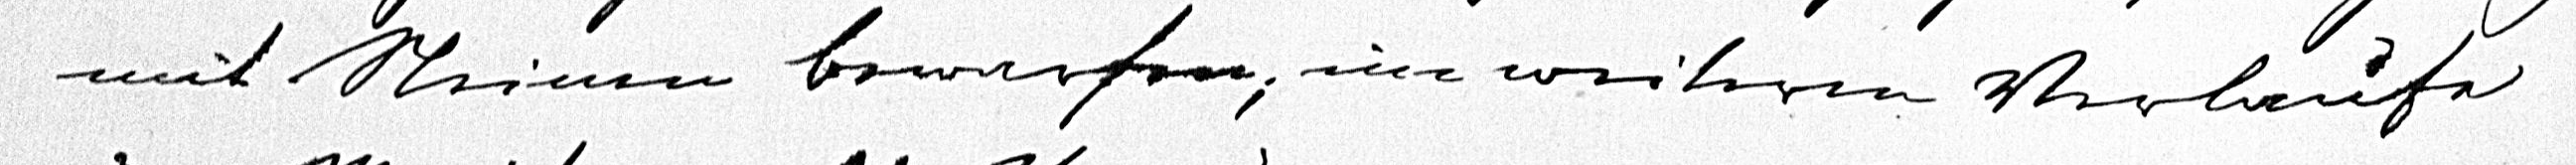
mit Steinen bewarfen; im weiteren Verlaufe
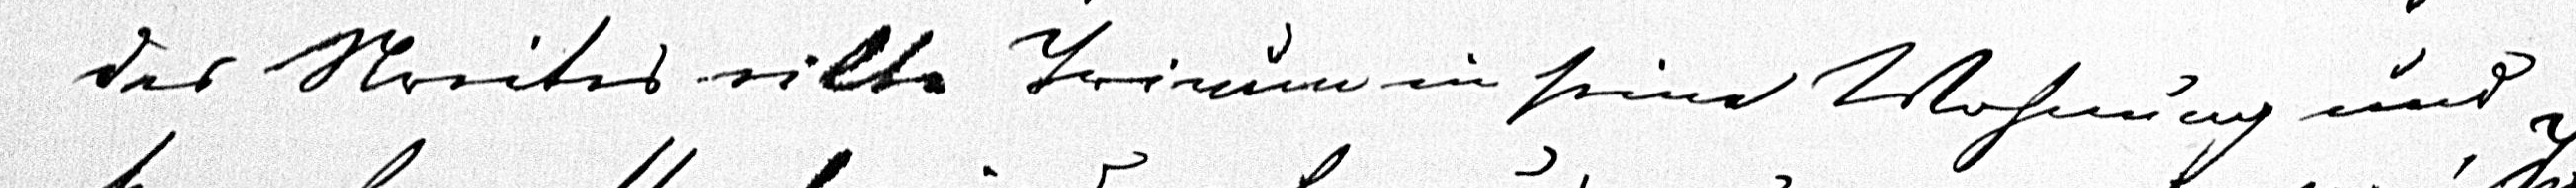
des Streites eilte Trivun in seine Wohnung und
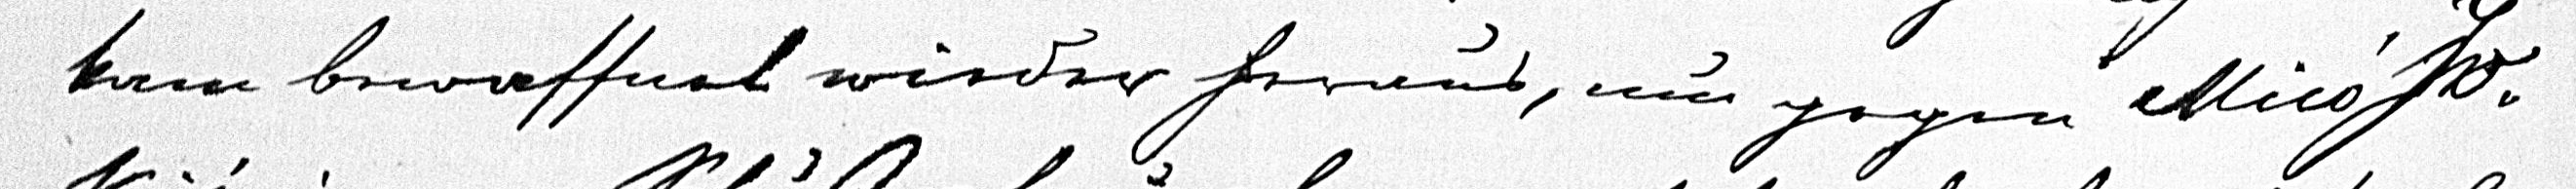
kam bewaffnet wieder heraus, um gegen Mićo Jo¬
